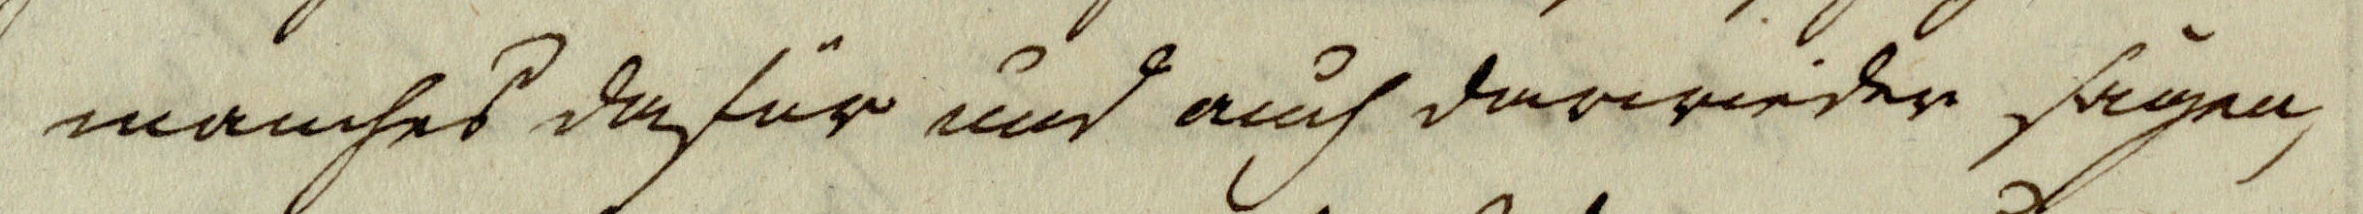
manches dafür und auch darwieder sagen,
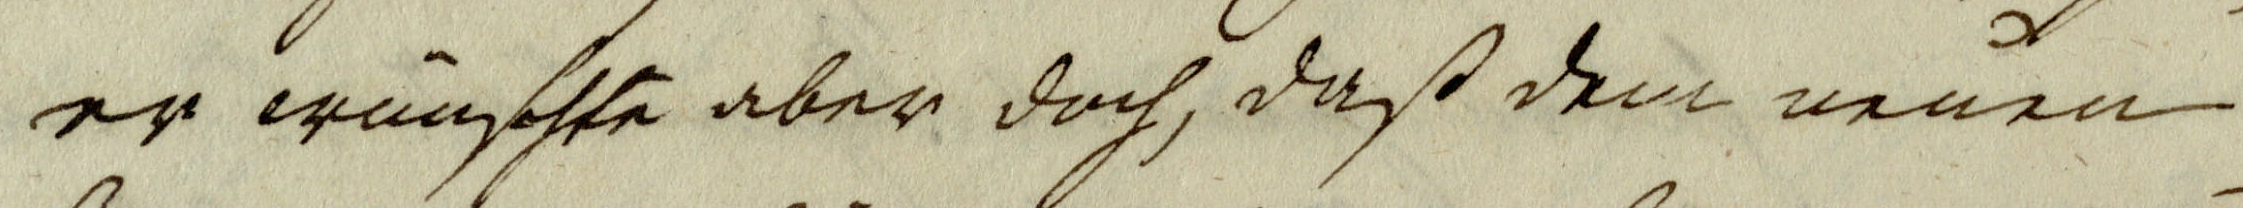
er wünschte aber doch, daß dem neuen
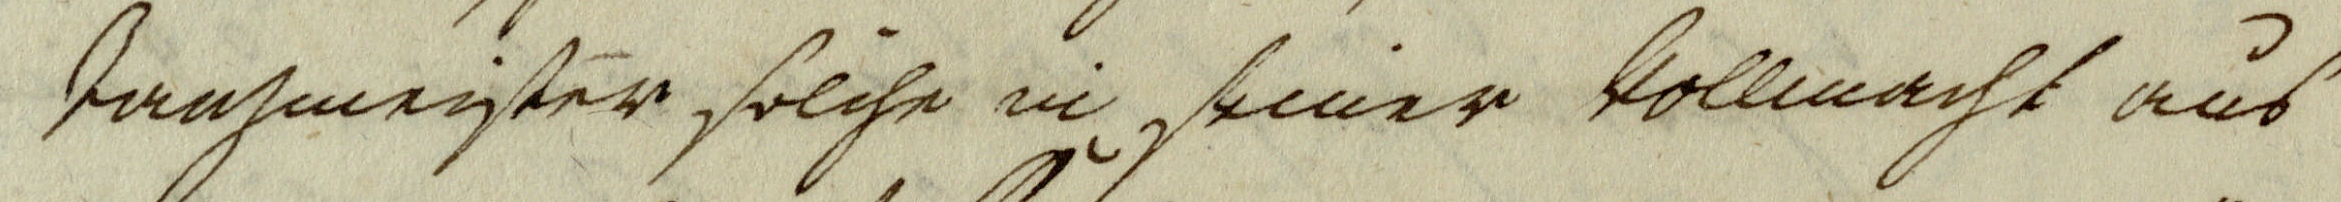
Tanzmeister solche in seiner Vollmacht aus
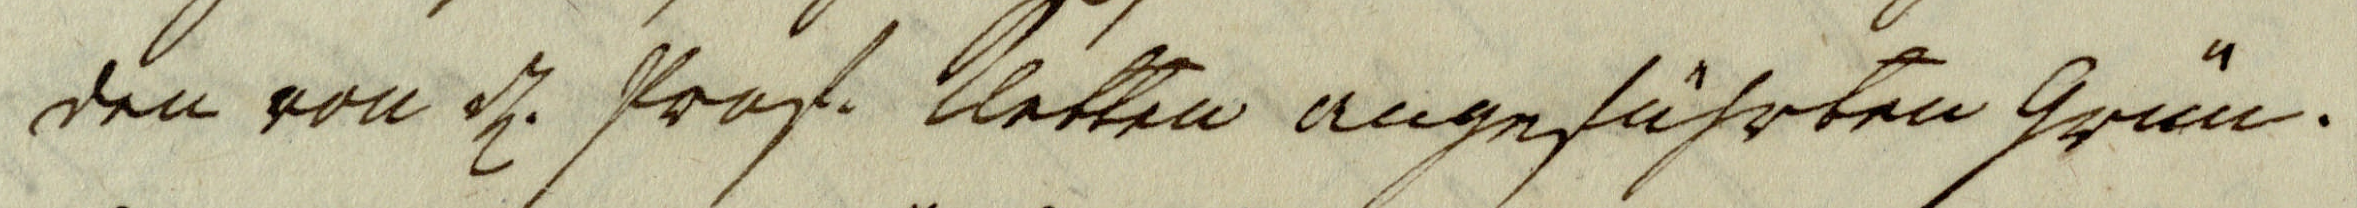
den von dh. Prof. Kletten angeführten Grün¬
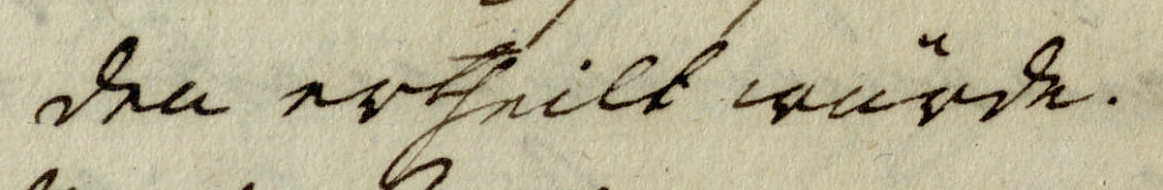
den ertehilt würde.
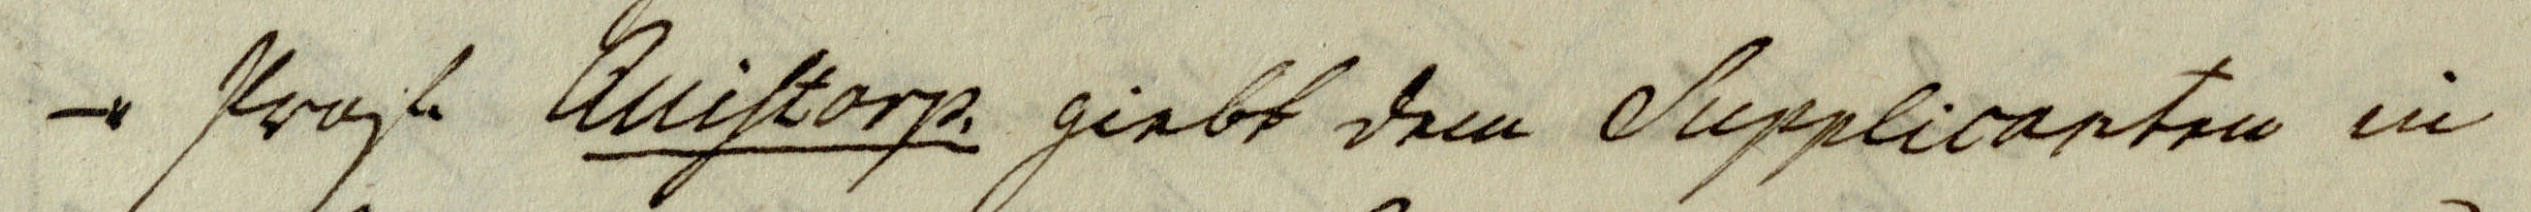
— " Prof. Quistorp. giebt dem Supplicanten in
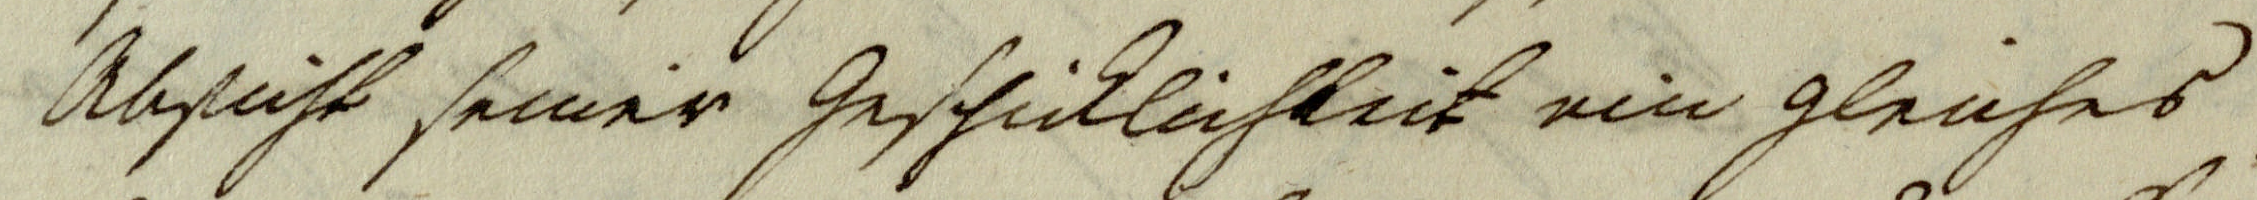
Absicht seiner Geschicklichkeit ein gleiches
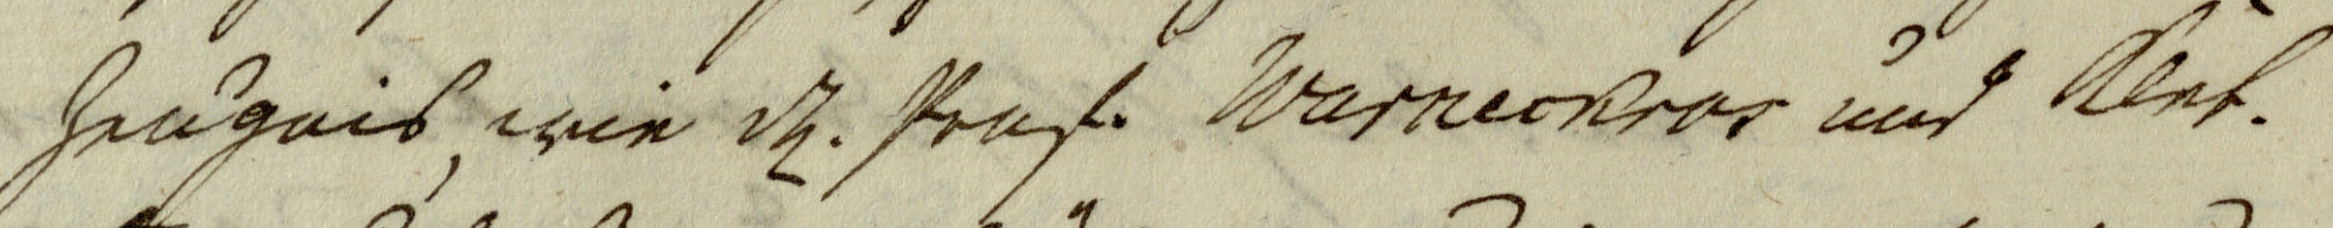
Zeugnis, wie dh. Prof. Warneckros und Klet¬
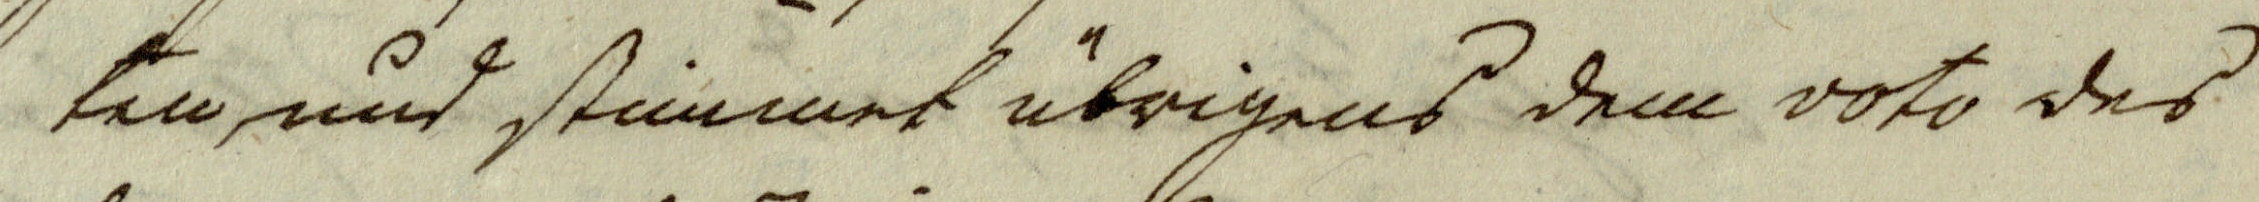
ten und stimmet übrigens dem voto des
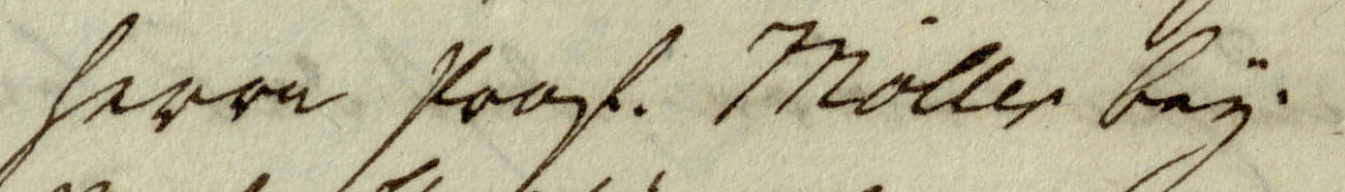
Herrn Prof. Möller beÿ.
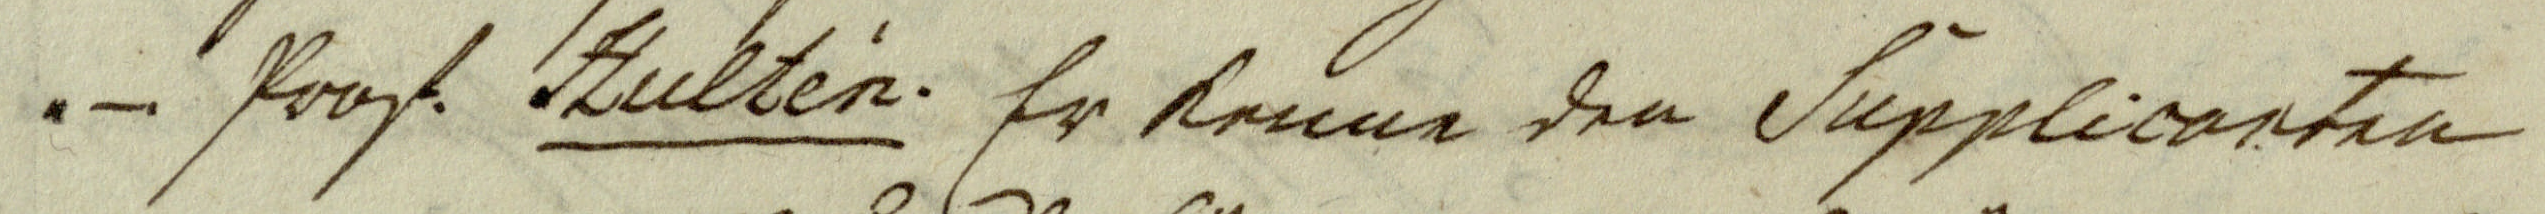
" — . Prof. Hultén. Er kenne den Supplicanten
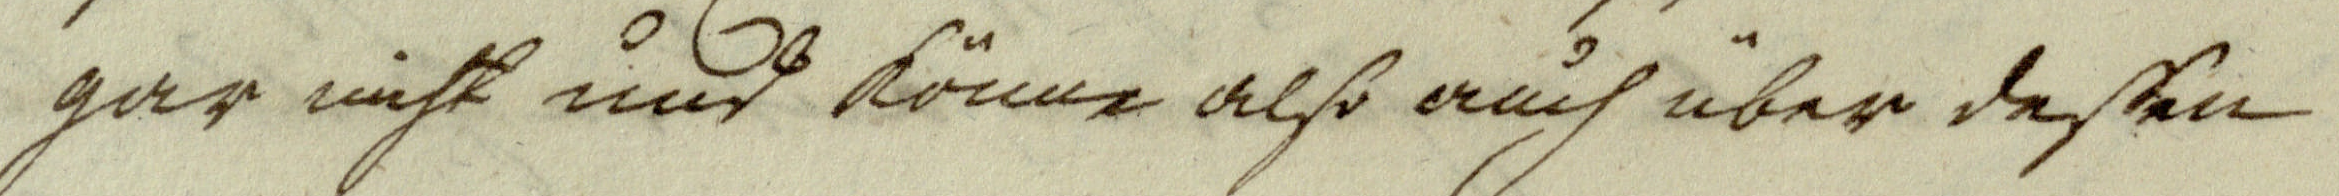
gar nicht und könne also auch über dessen
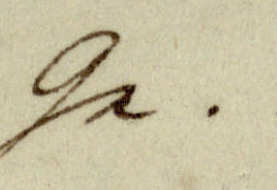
Ge¬
